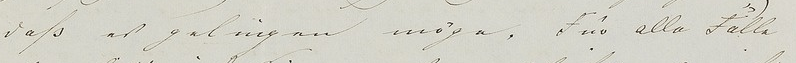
daß es gelingen möge. Für alle Fälle
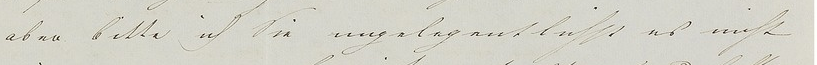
aber bitte ich Sie angelegentlichst es nicht
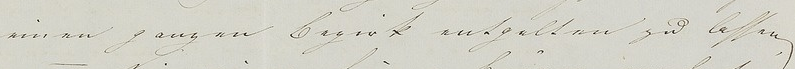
einen ganzen Bezirk entgelten zu lassen,
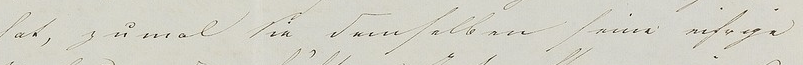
hat, zumal Sie demselben seine eifrige
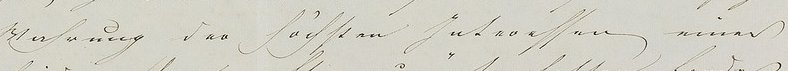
Wahrung der höchsten Interessen einer
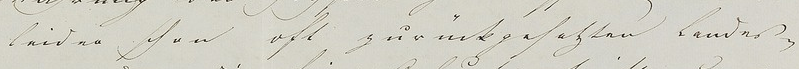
leider schon oft zurückgesetzten Landes-
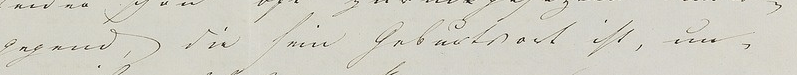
gegend, die sein Geburtsort ist, un-
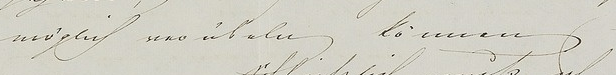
möglich verübeln können.
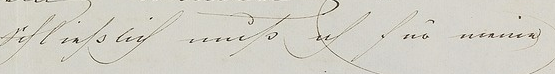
Schließlich muß ich für meine
